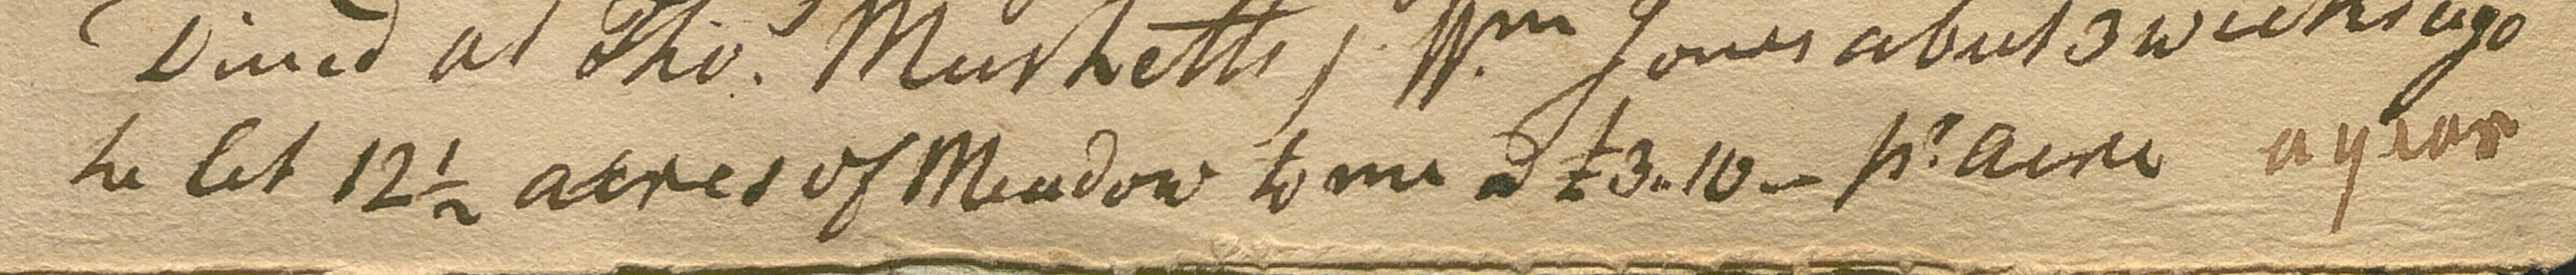he let 12 1/2 acres of Meadow to me @3..10- p^r. Acre a year
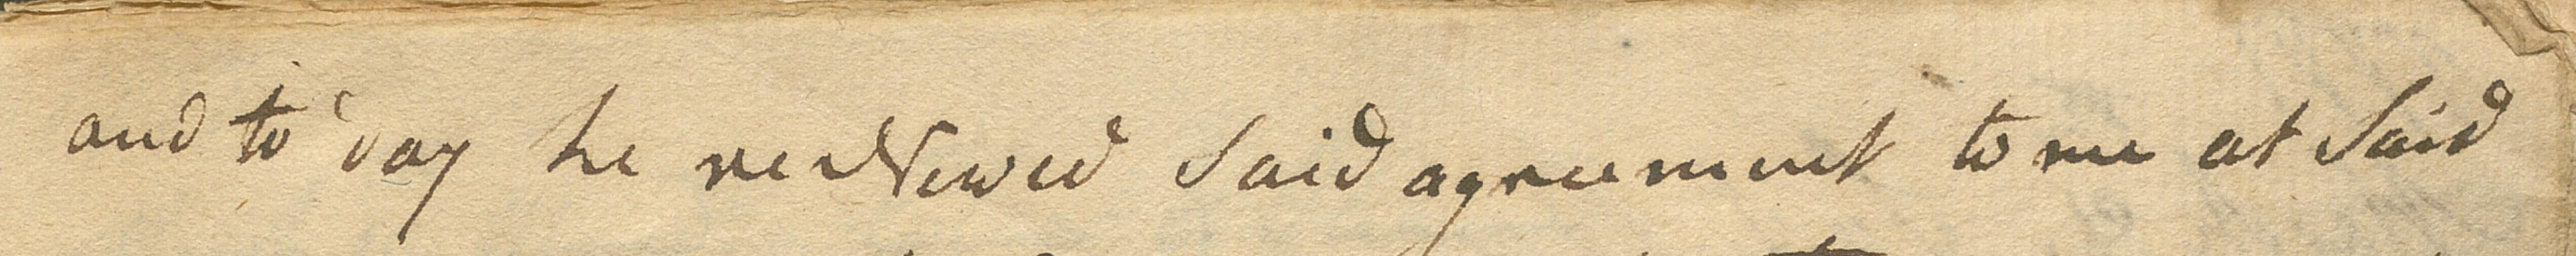and to day he re Newed said agreement to me at Said
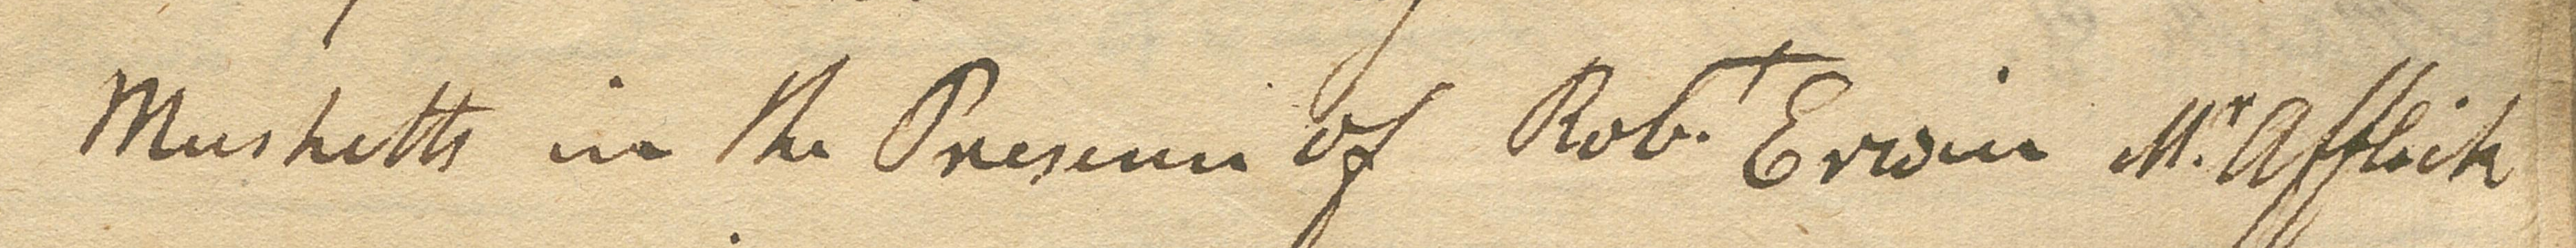Mushetts in the Presence of Rob^t. Erwin M^r. Afflick
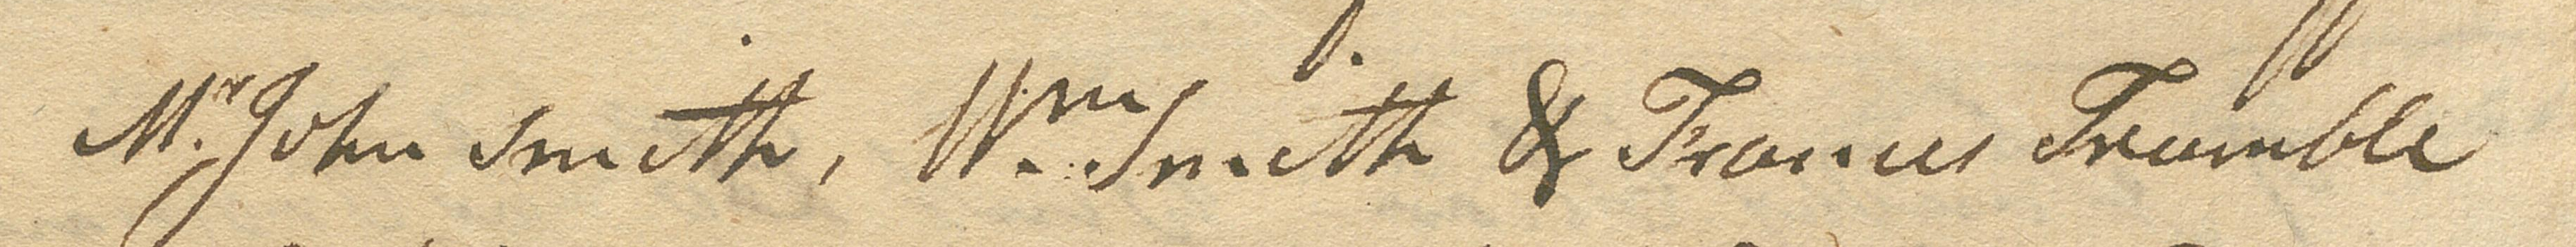M^r. John Smith, W^m. Smith & Frances Trumble
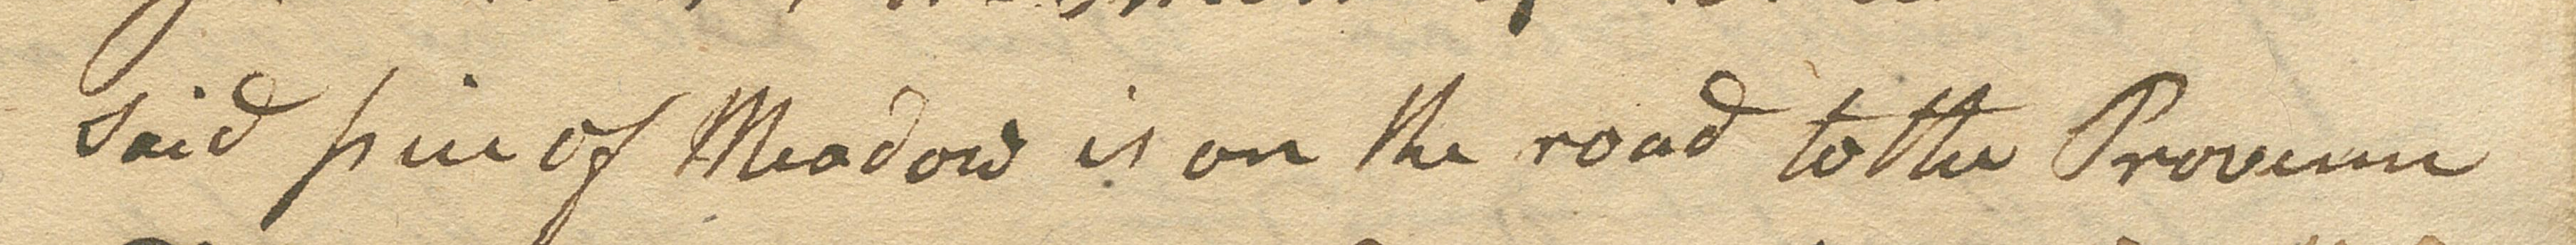said pice of Meadow is on the road to the Provence
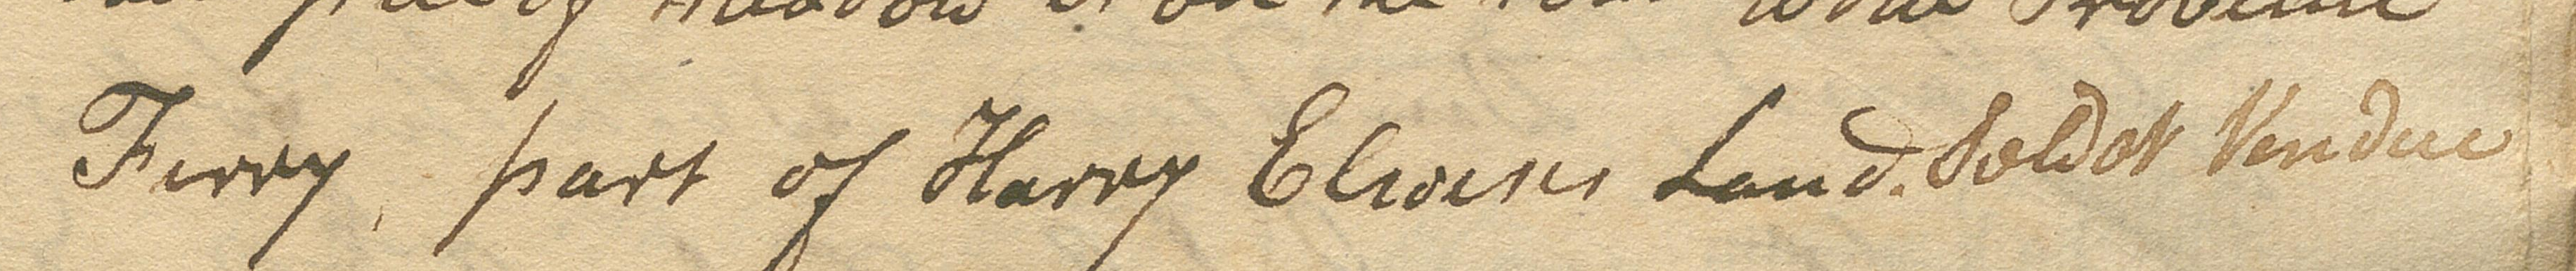Ferry, part of Harry Eliveses Land Sold at Vendue
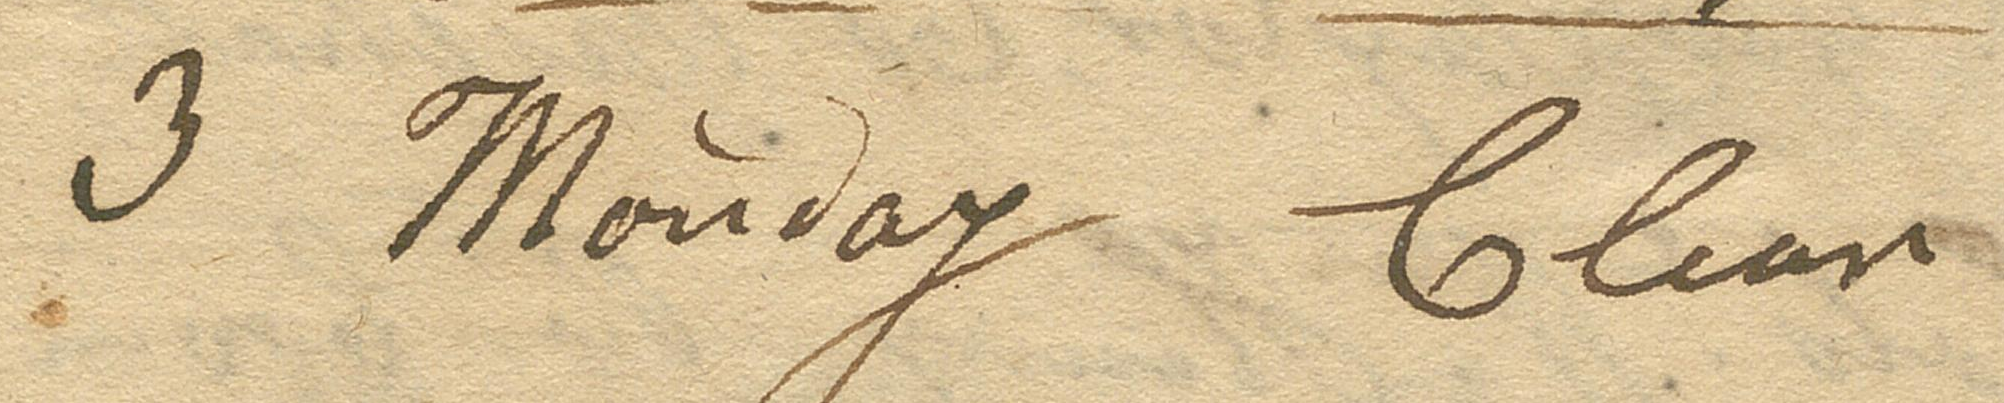3 Monday Clear
